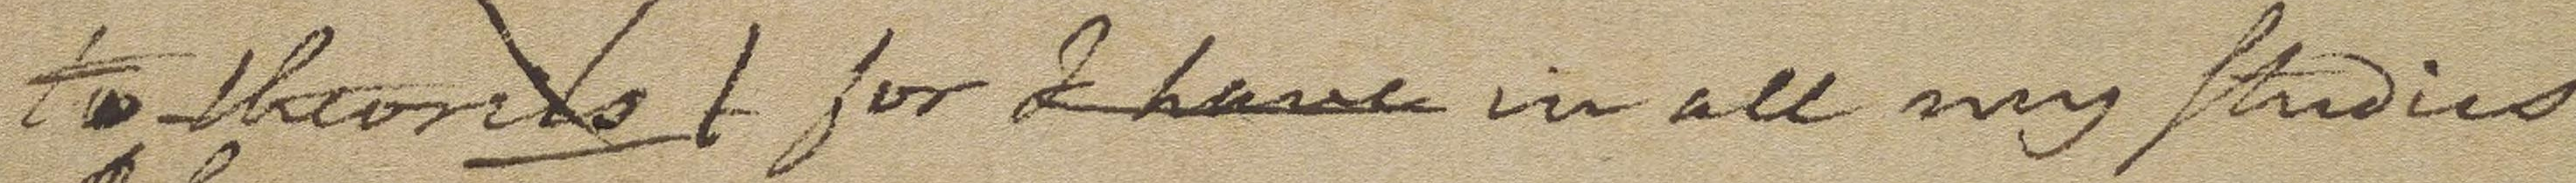to theories.) For [I have] in all my studies
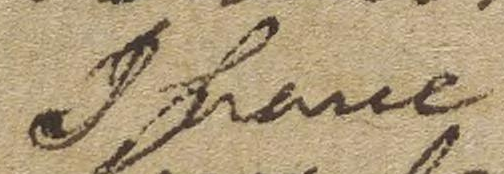I have
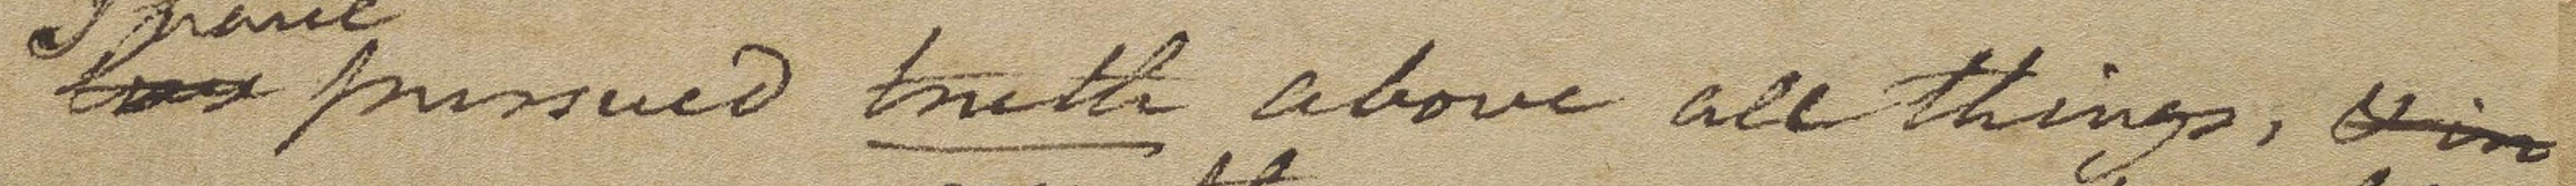[___] pursued truth above all things, [& in]
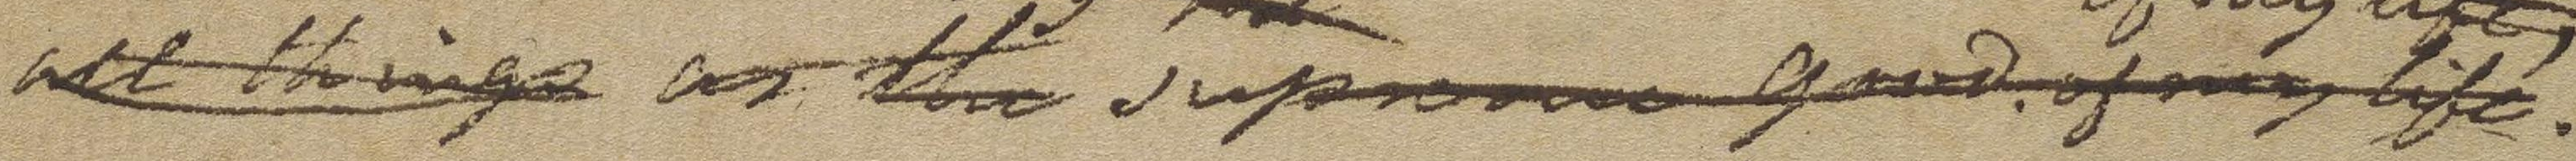[all things] as [the supreme good of my life]
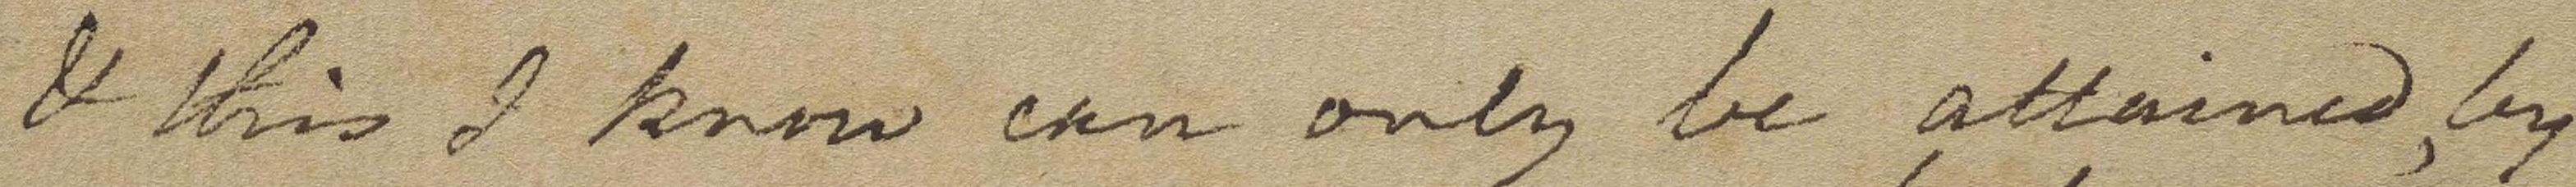& this I know can only be attained, by
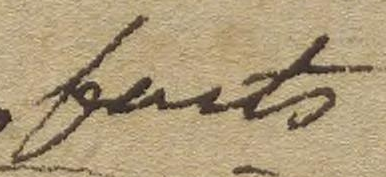facts
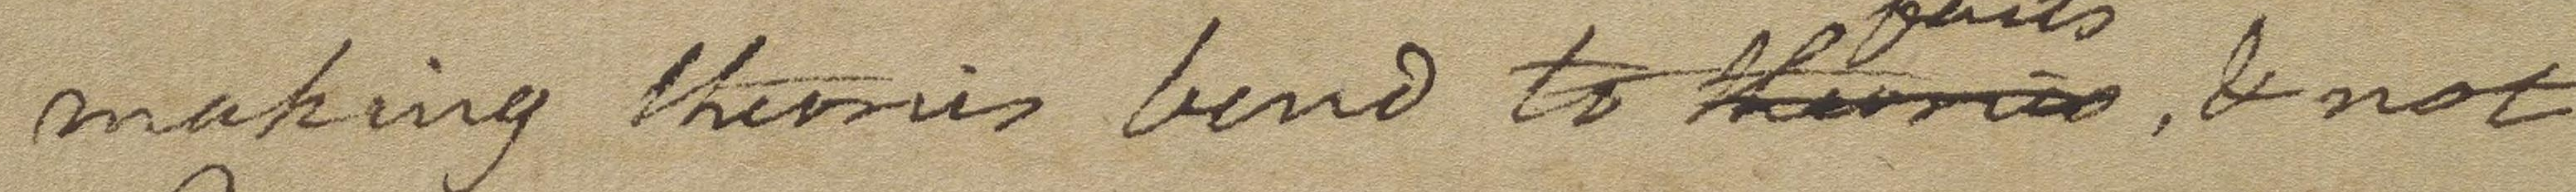making theories bend to [theories], & not
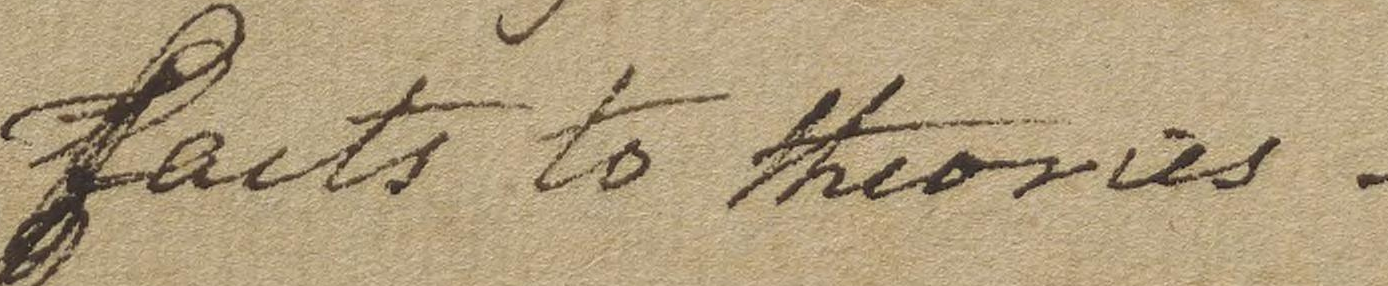facts to theories.
